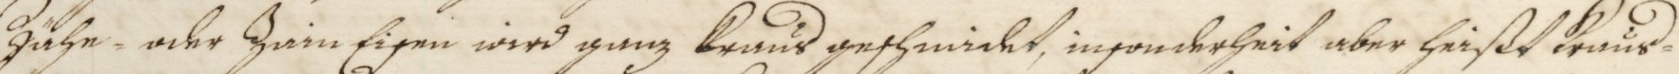Zähn- oder Zain Eisen wird ganz kraus geschmidet, insonderheit aber heißt Kraus-
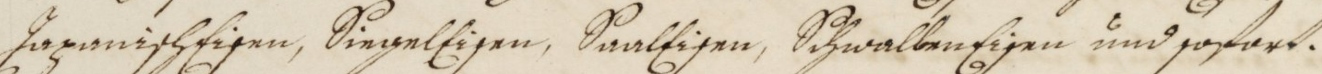JapanischEisen, SiegelEisen, SaalEisen, SchwalbenEisen und sofort.
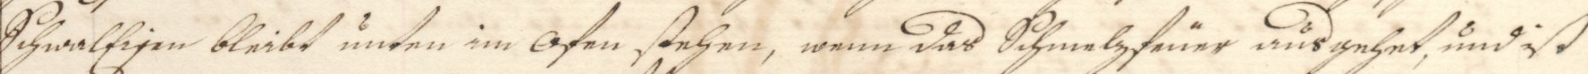SchwalEisen bleibt unten im Ofen stehen, wenn das Schmelzfeüer ausgehet, und ist
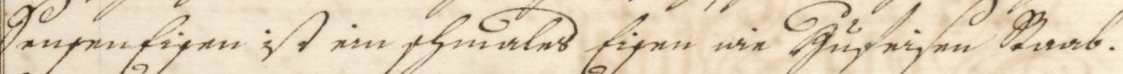SensenEisen ist ein schmales Eisen wie Hufeisen Staab.
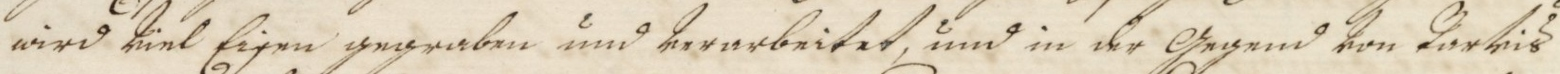wird viel Eisen gegraben und verarbeitet, und in der Gegend von Tarvis
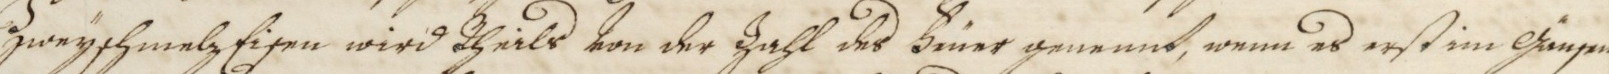ZweyschmelzEisen wird Theils von der Zahl des Feüer genennt, wenn es erst im Gänsen
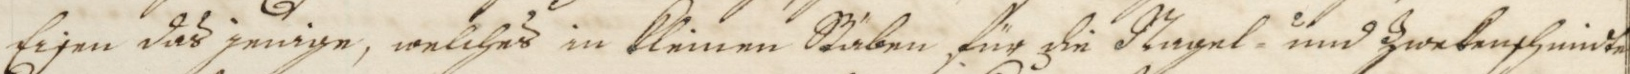Eisen das jenige, welches in kleinen Stäben für die Nagel- und Zwekenschmidte
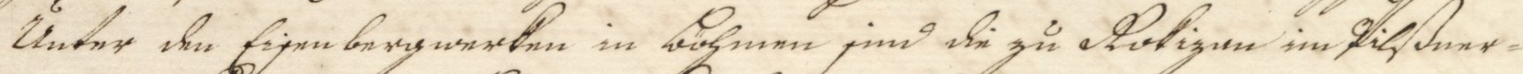Unter den Eisenbergwerken in Böhmen sind die zu Rokizan im Pilßner-
